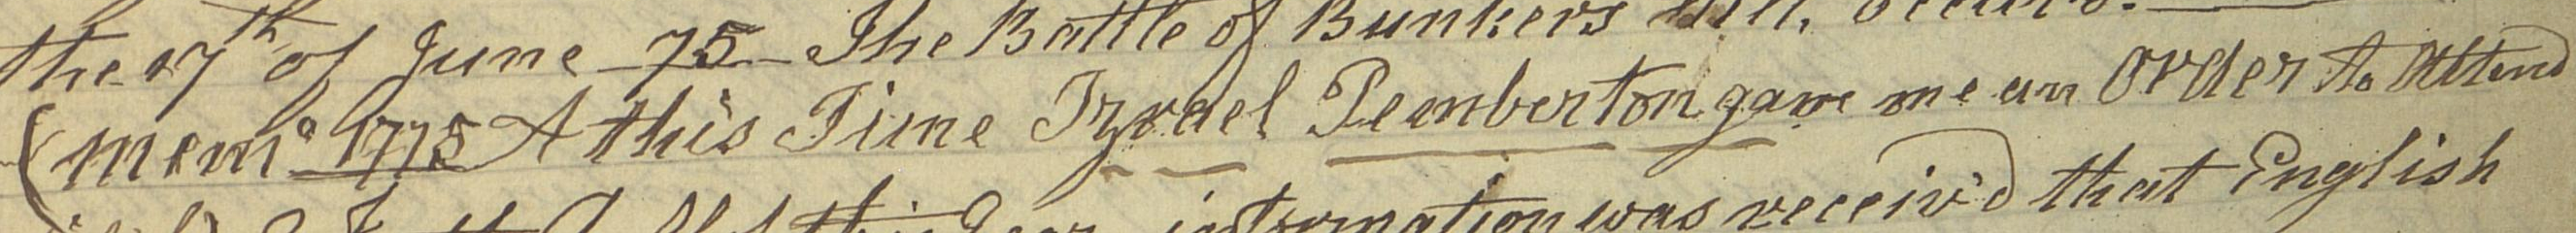(mem^o 1775 A this time Izrael Pemberton gave me an Order to Attend
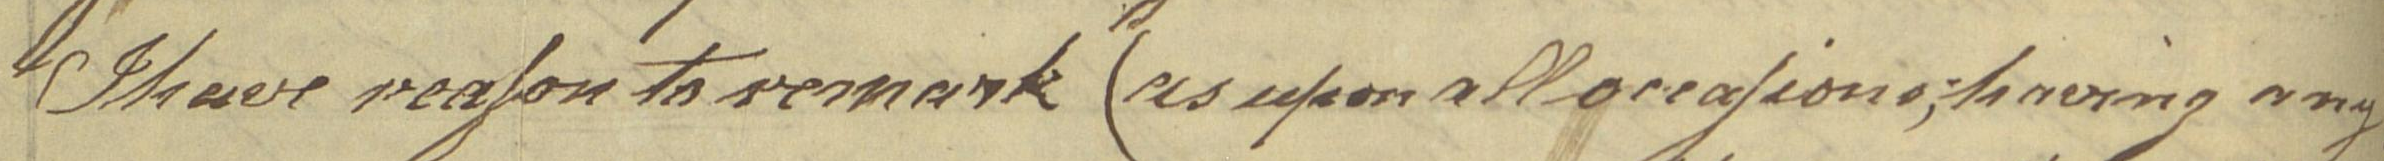I have reason to remark (as upon all occasions; having any
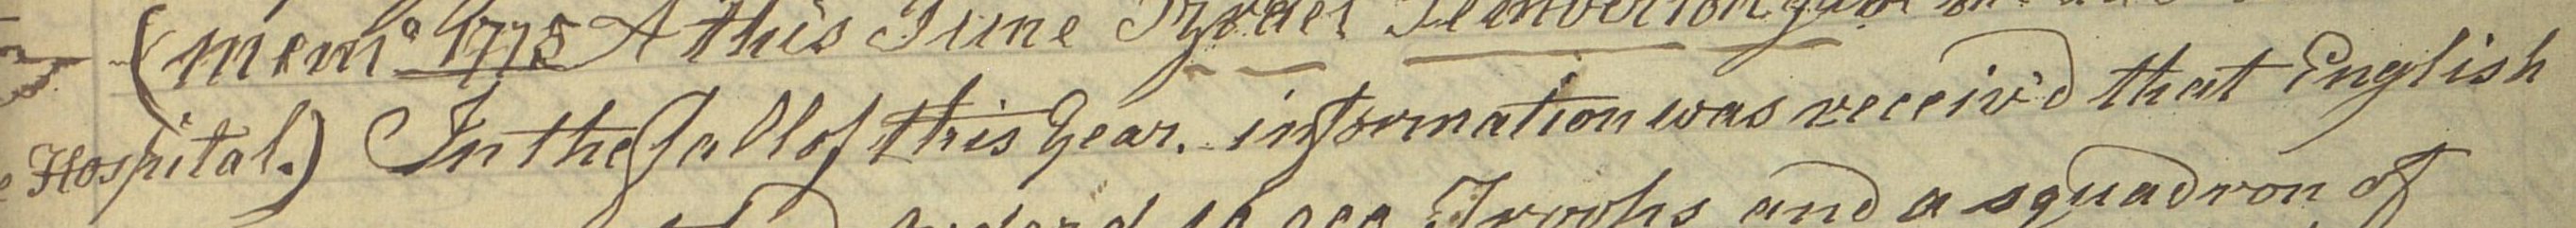Hospital.) In the fall of this Year. information was receive'd that English
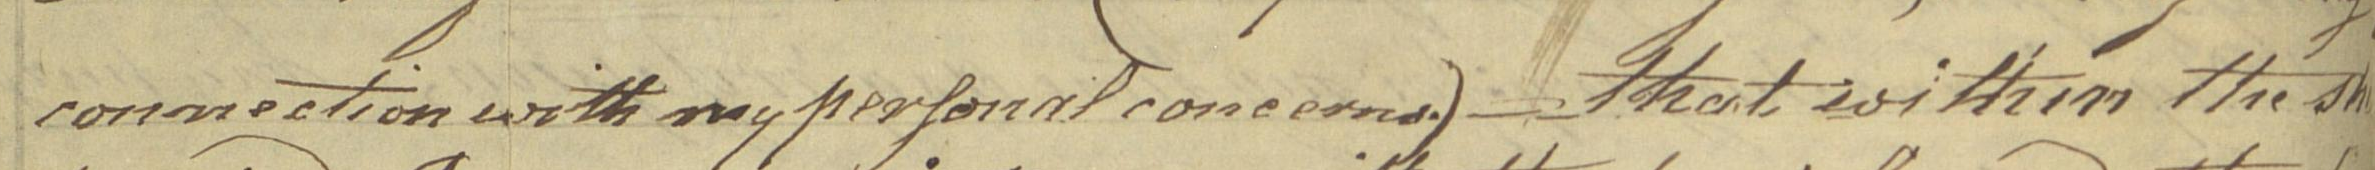connection with my personal concerns.) that within the sh-
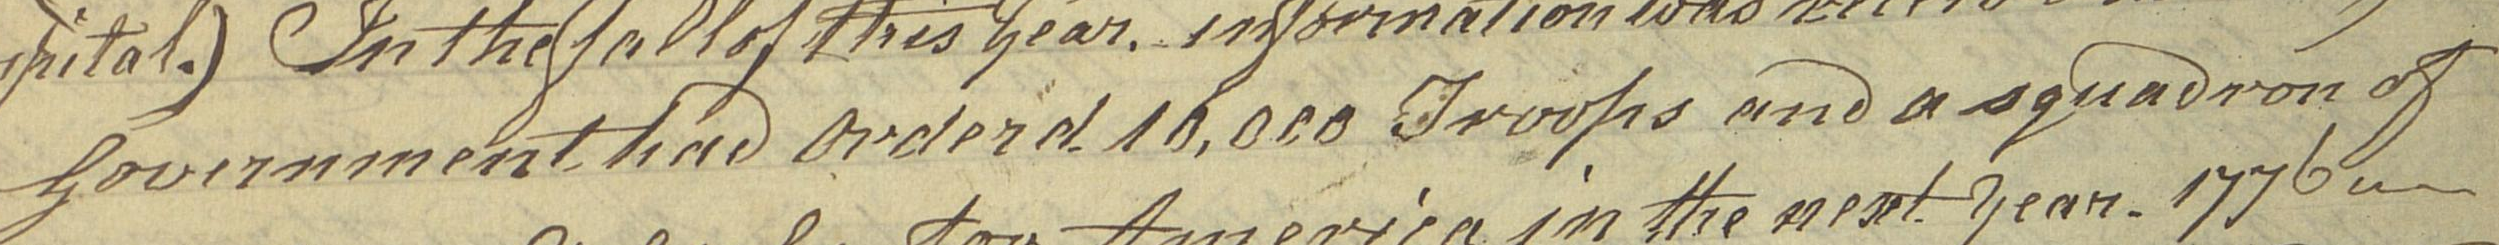Government had Orderd 10,000 Troops and a squadron of
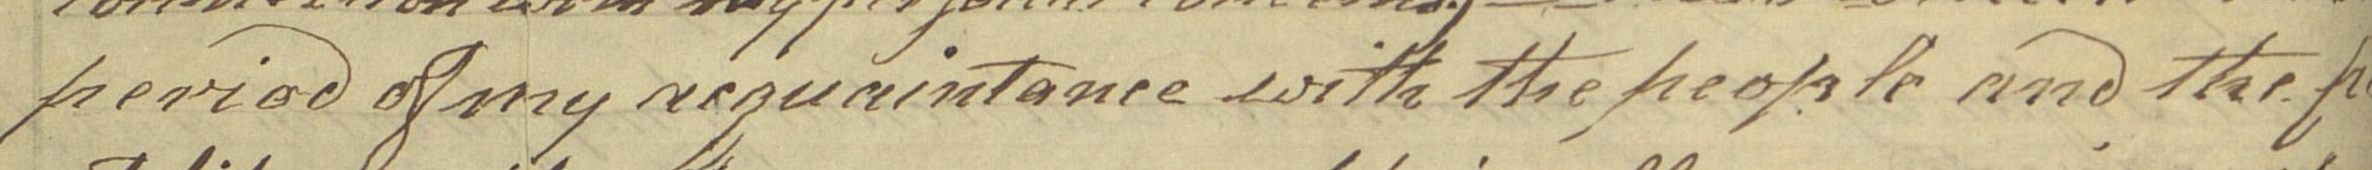period of my acquaintance with the people and the po-
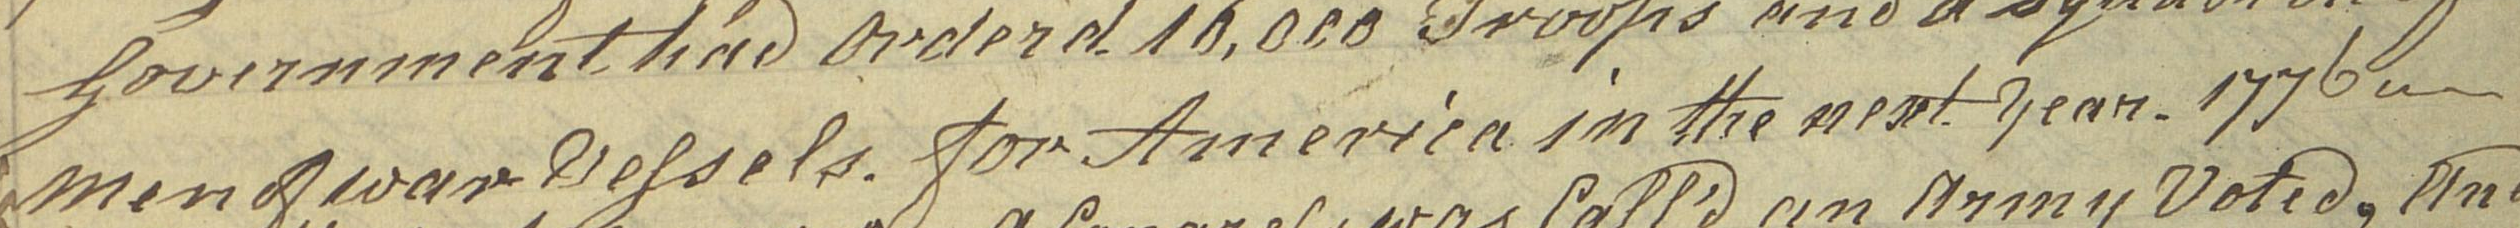men of war Vessels. for America in the next year. 1776
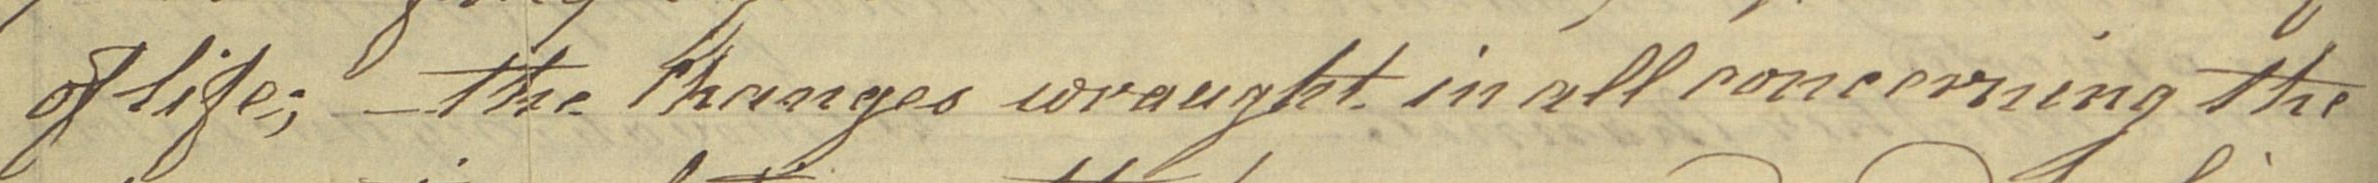of life; the Changes wrought in all concerning the
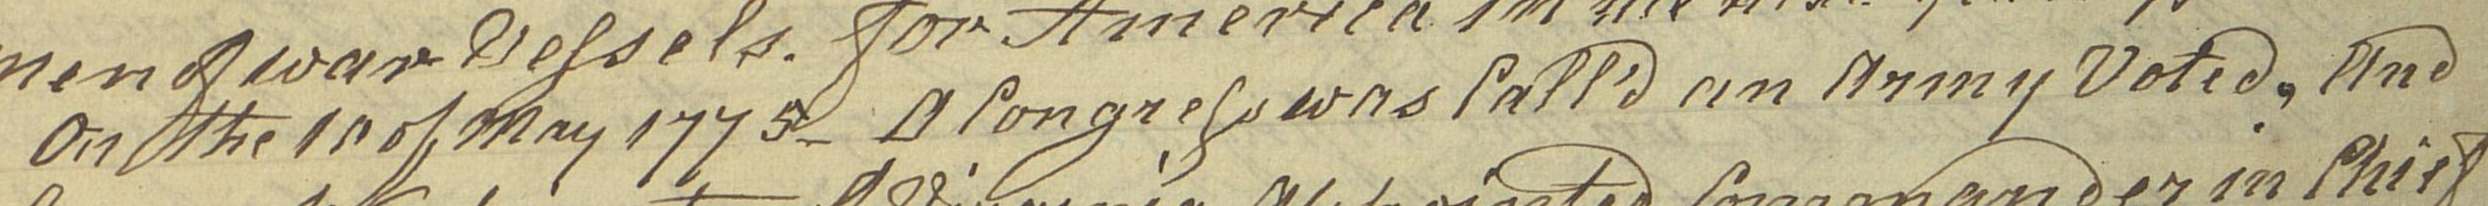on the 11 of May 1775 A Congress was Call'd an Army Voted, And
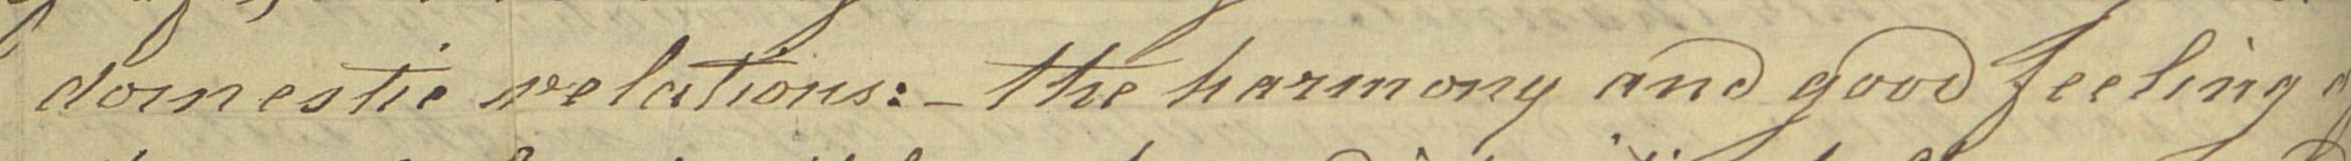domestic relations: the harmony and good feeling of
